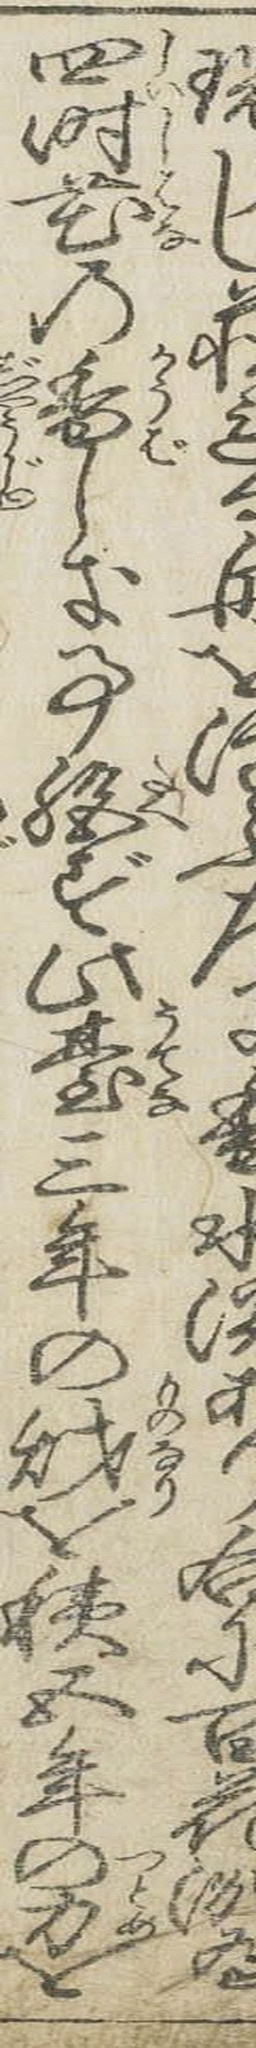四時花の香しき事絶ず此台三年の財を積五年の力を
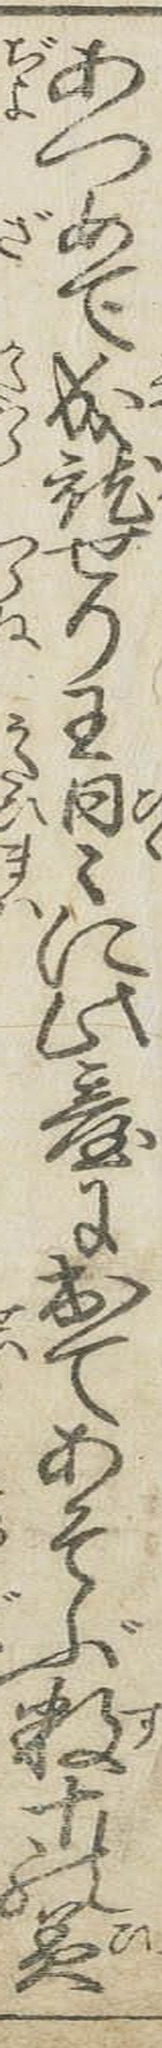あつめて成就せり王日々に此台に出てあそぶ数十の美
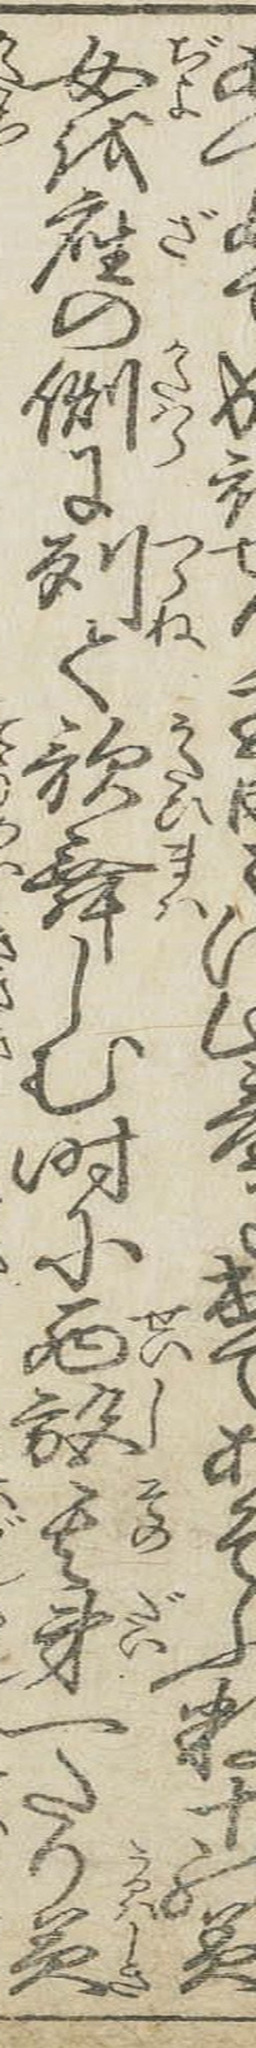女を座の側に列て歌舞しむ時に西施其第一たり美
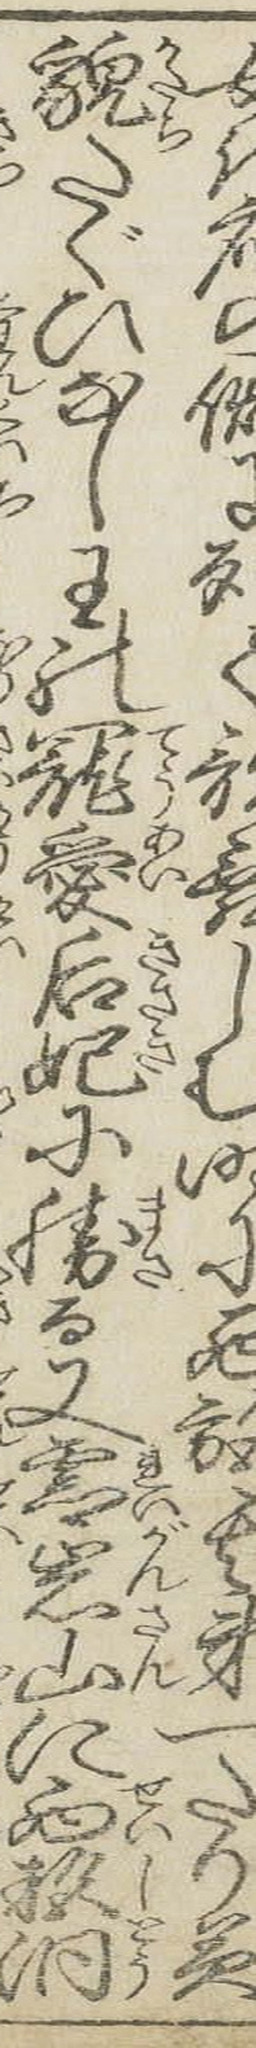貌たぐひなし王の寵愛后妃に勝る又霊岩山に西施洞
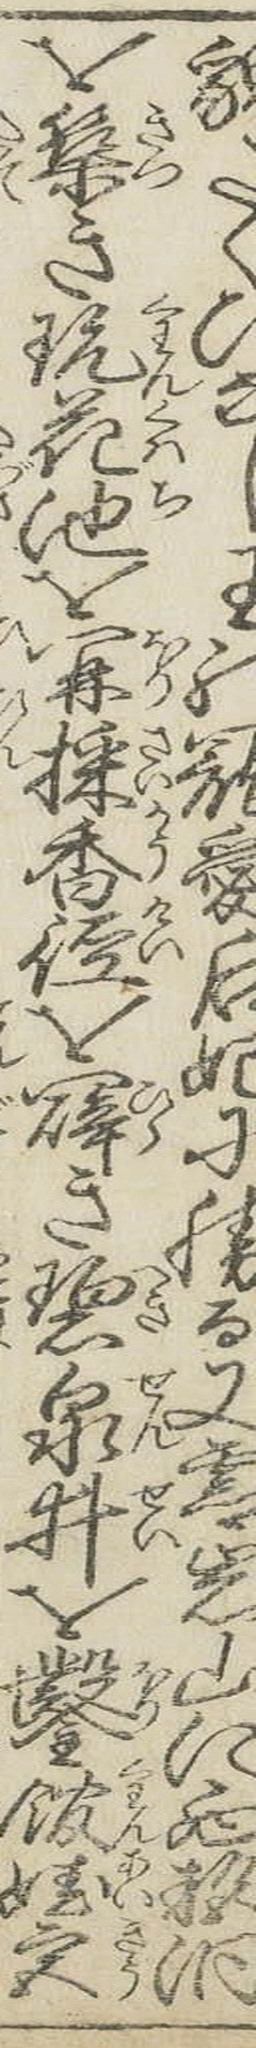を築き玩花池を開採香径を闢き碧泉井を鑿館娃宮
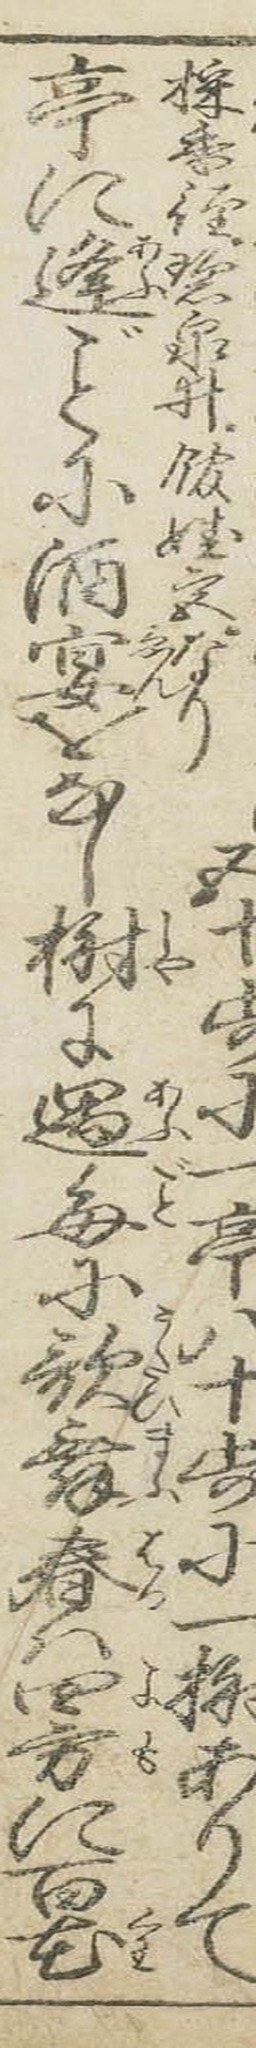亭に逢ごとに酒宴をなし榭に遇毎に歌舞春は四方に百花
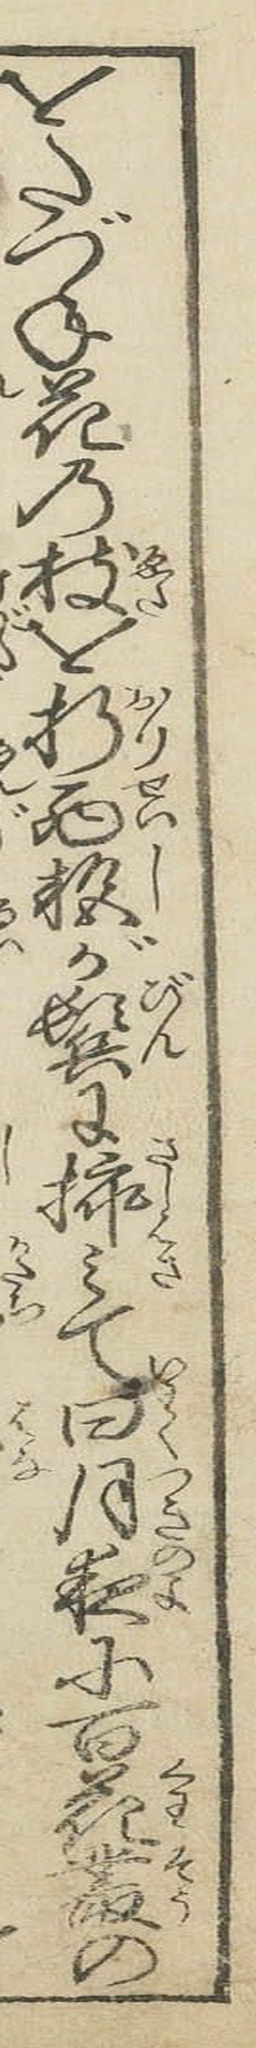をたづね花の枝を折西施が鬢に插みて曰月夜に百花叢の
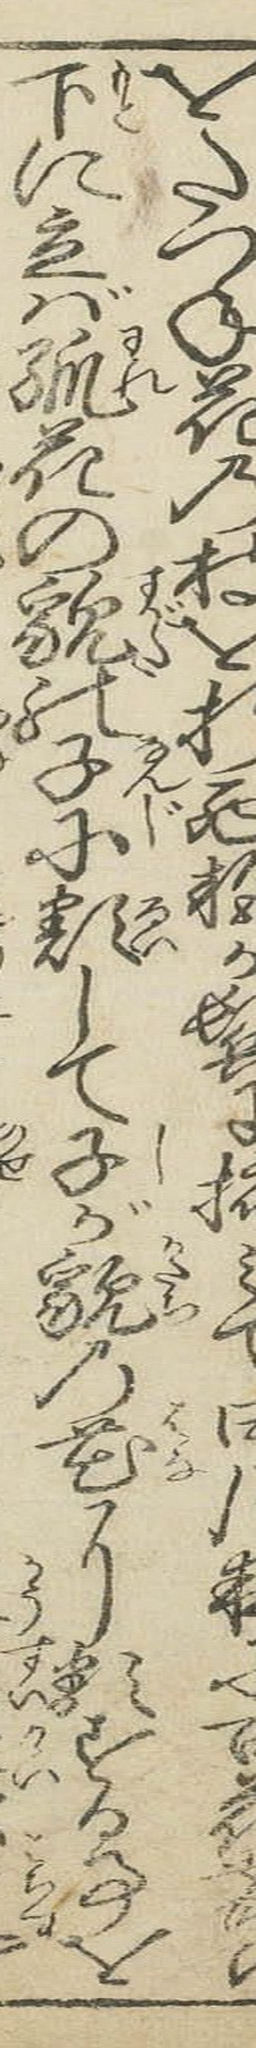下に立ば孤花の貌の子に類して子が貌の花に類する事を
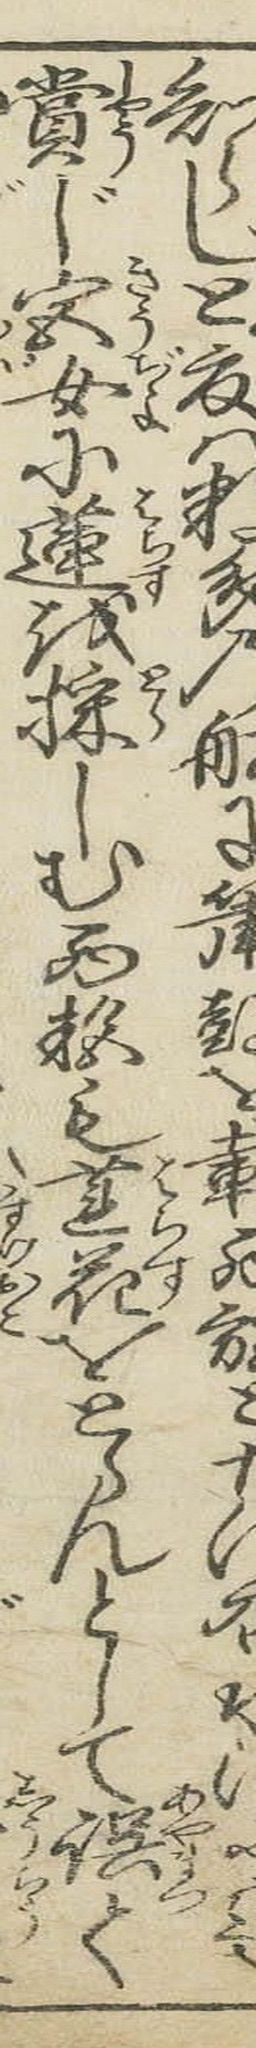賞じ宮女に蓮を採しむ西施も蓮花をとらんとして誤て
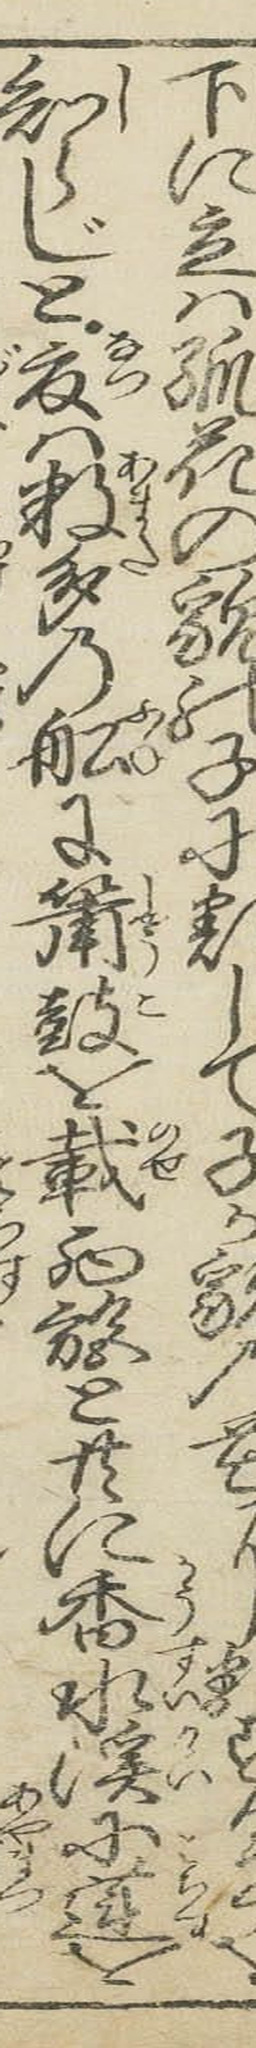知らじと。夏は数多の船に簫鼓を載西施と共に香水溪に蓮を
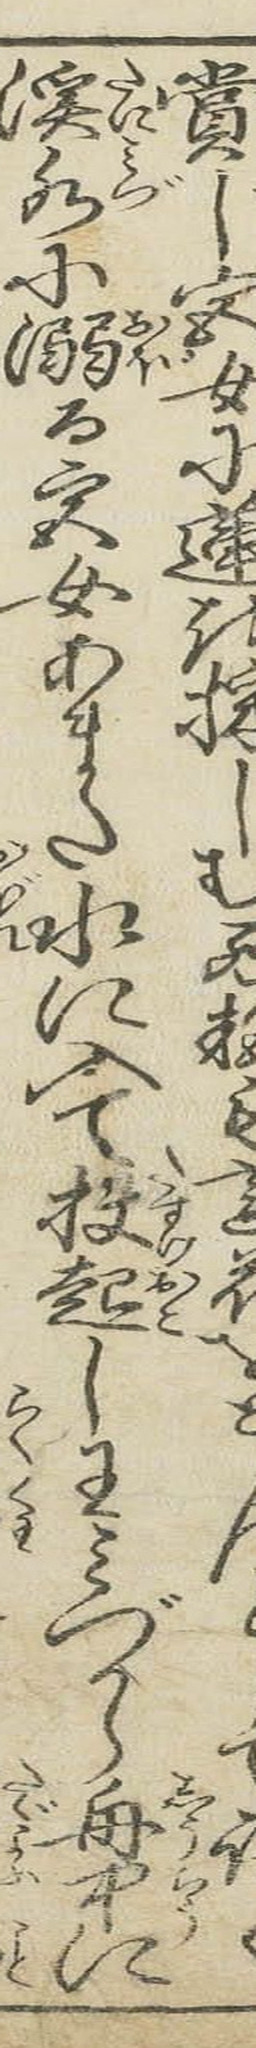溪水に溺る宮女あまた水に入て扶起し王みづから舟中に
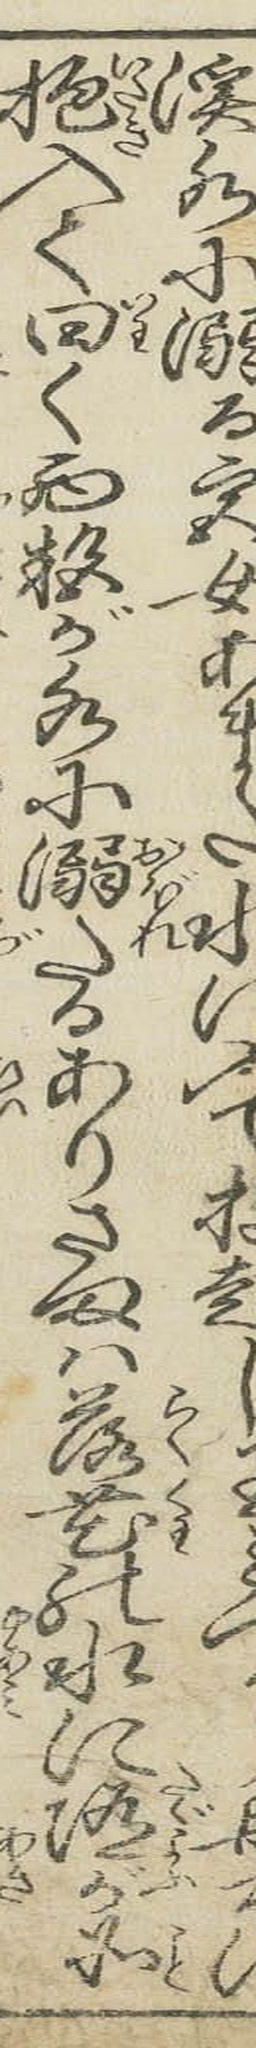抱入て曰く西施が水に溺たるありさまは落花の水に随が如
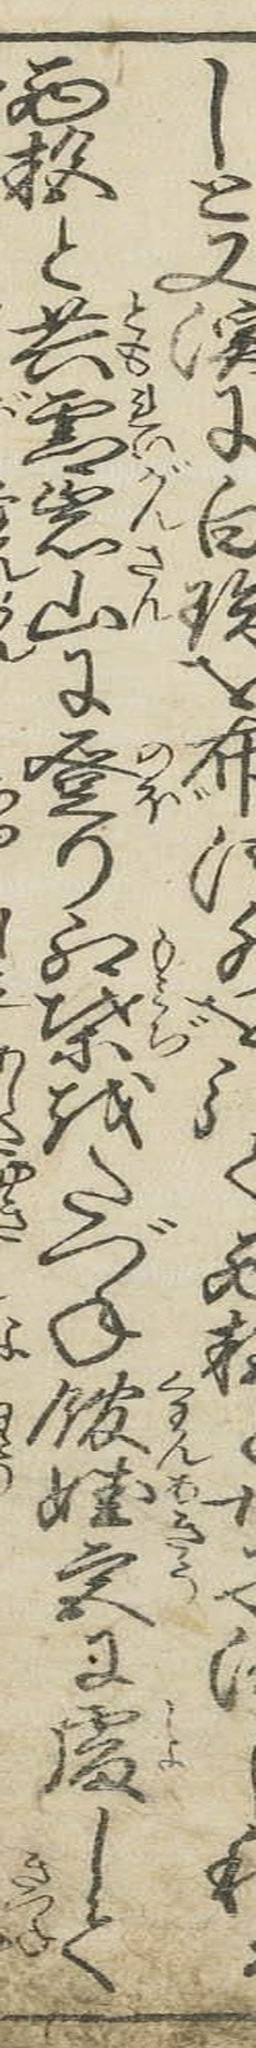西施と共霊岩山に登り紅葉をたづね館娃宮に処して
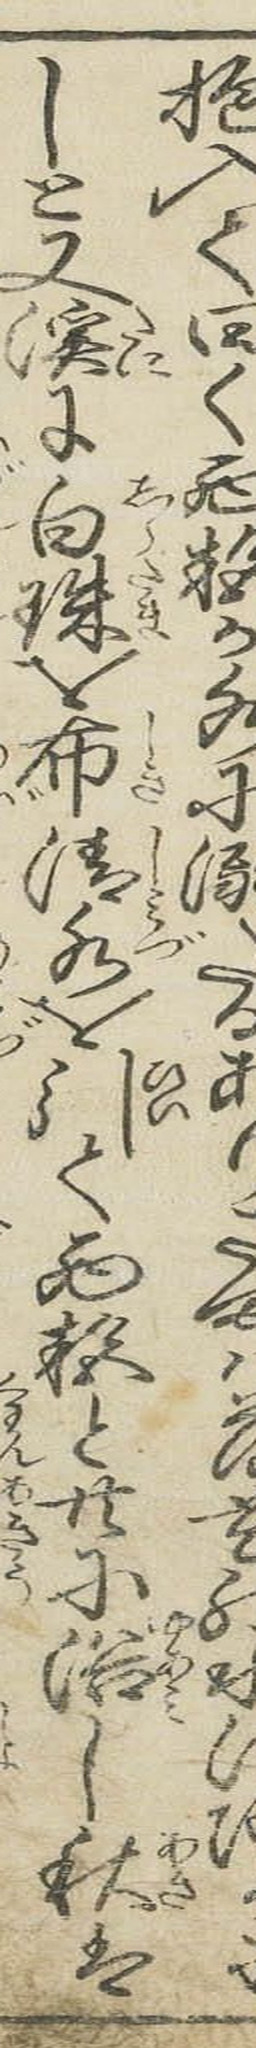しと又溪に白珠を布清水を引て西施と共に浴し秋は
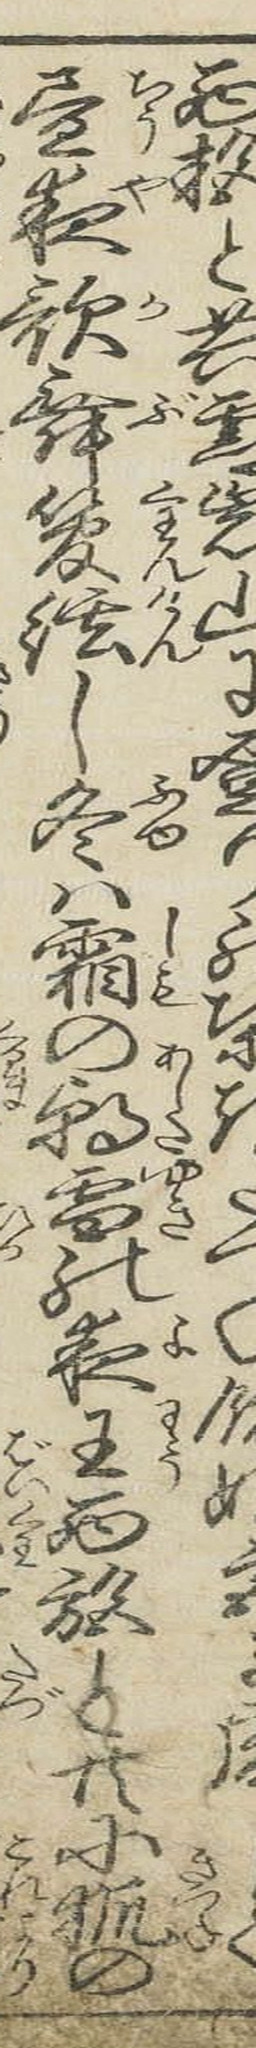昼夜歌舞管絃し冬は霜の朝雪の夜王西施と共に狐の
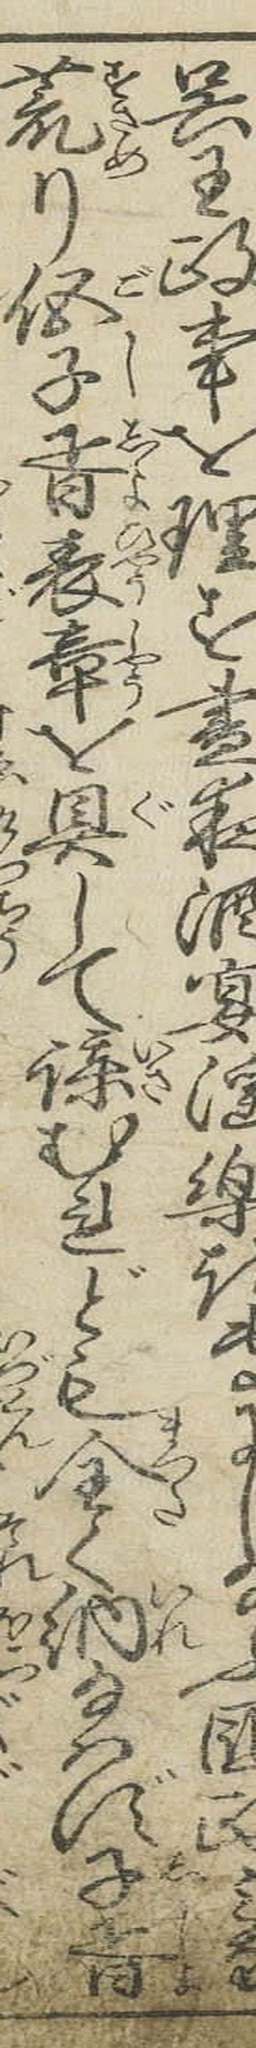荒り伍子胥表章を具して諫むれども全く納給はず子胥
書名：絵本写宝袋 9巻 6之巻
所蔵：東京学芸大学教育コンテンツアーカイブ
